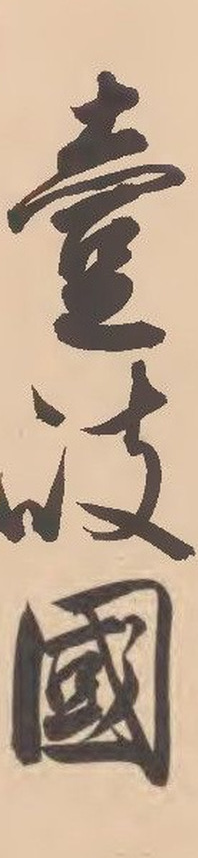壱岐国
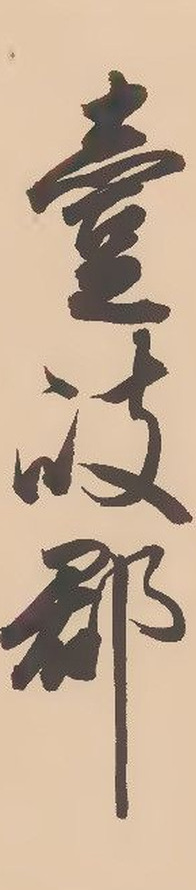壱岐郡
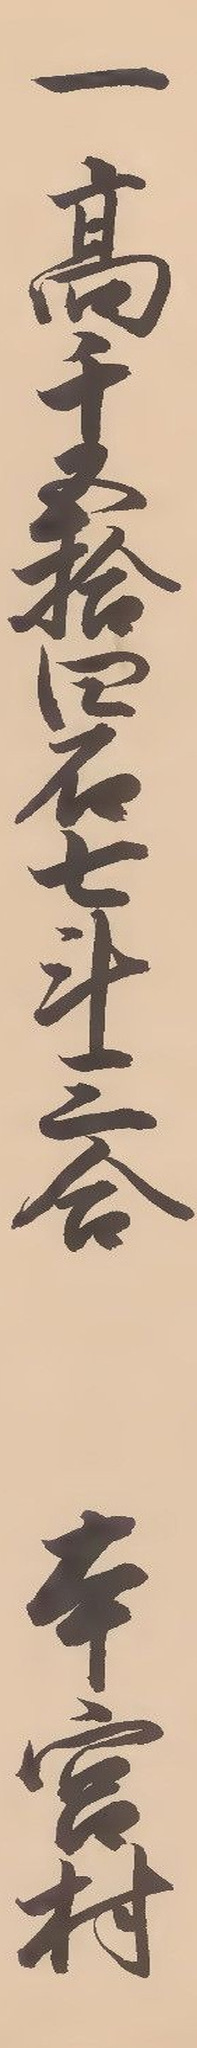一高千五拾四石七斗三合本宮村
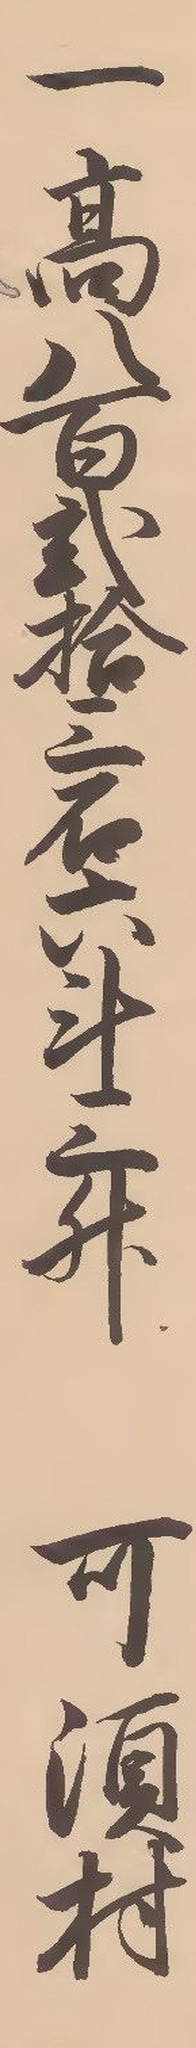一高八百弐拾三石六斗三升可須村

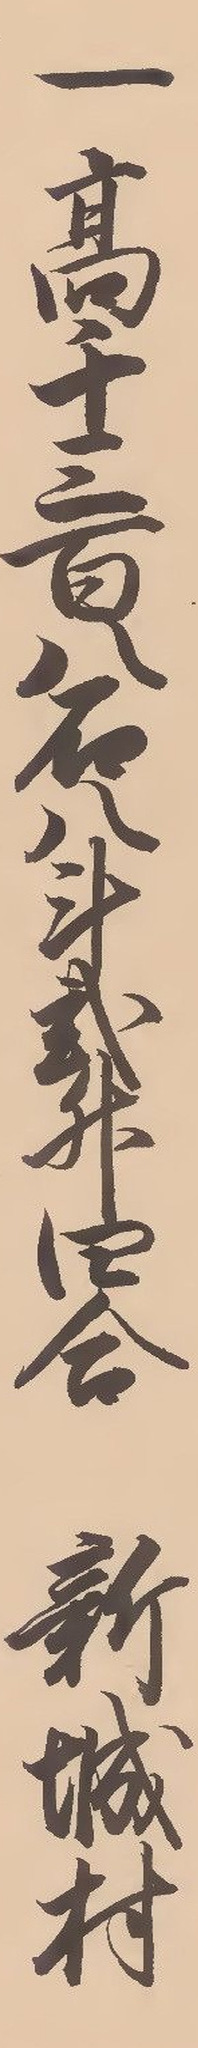一高千三百八石八斗弐升四合新城村
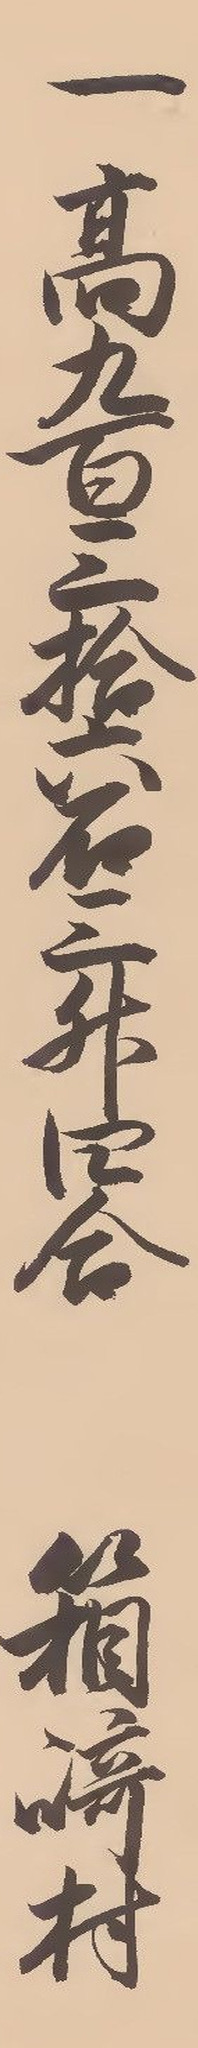一高九百三拾六石三升四合箱崎村
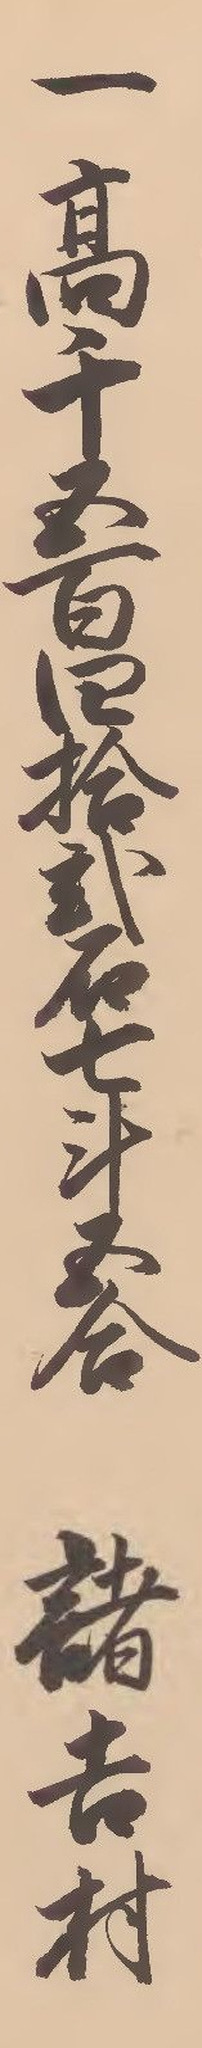一高千五百四拾弐石七斗五合諸吉村

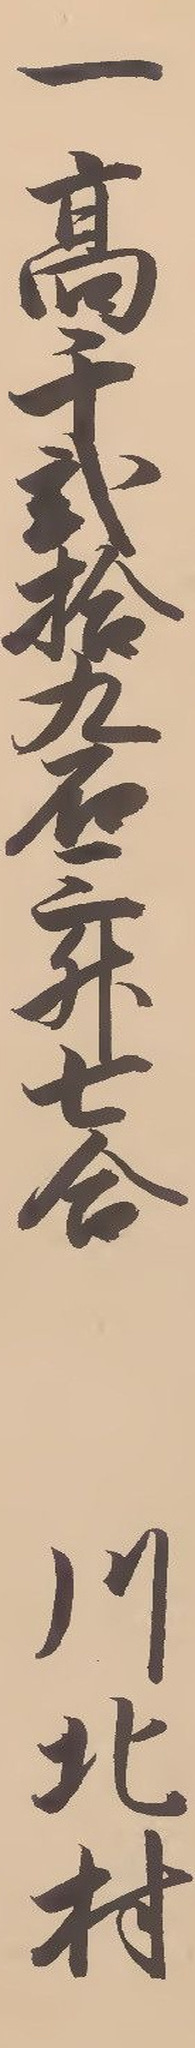一高千弐拾九石三升七合川北村
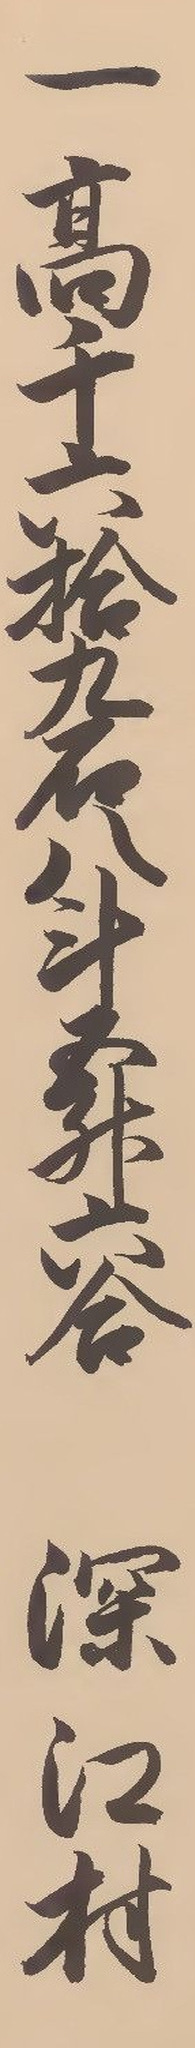一高千六拾九石八斗五升六合深江村
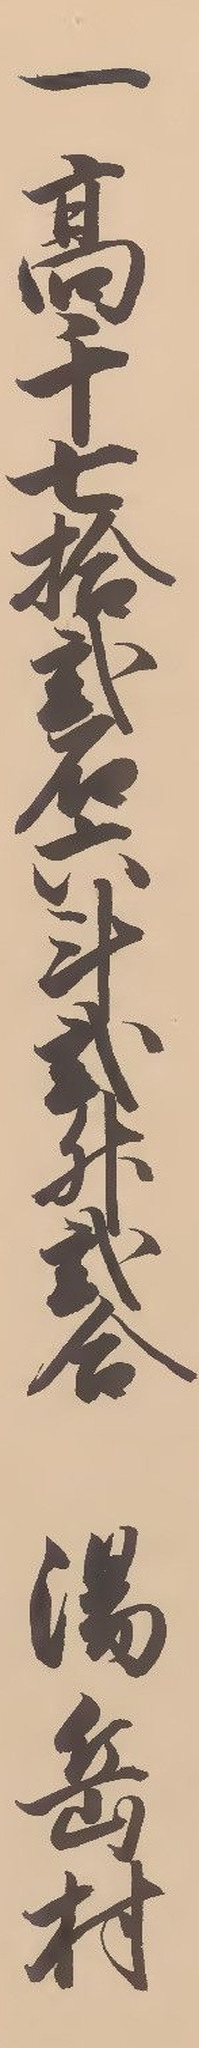一高千七拾弐石六斗弐升弐合湯岳村

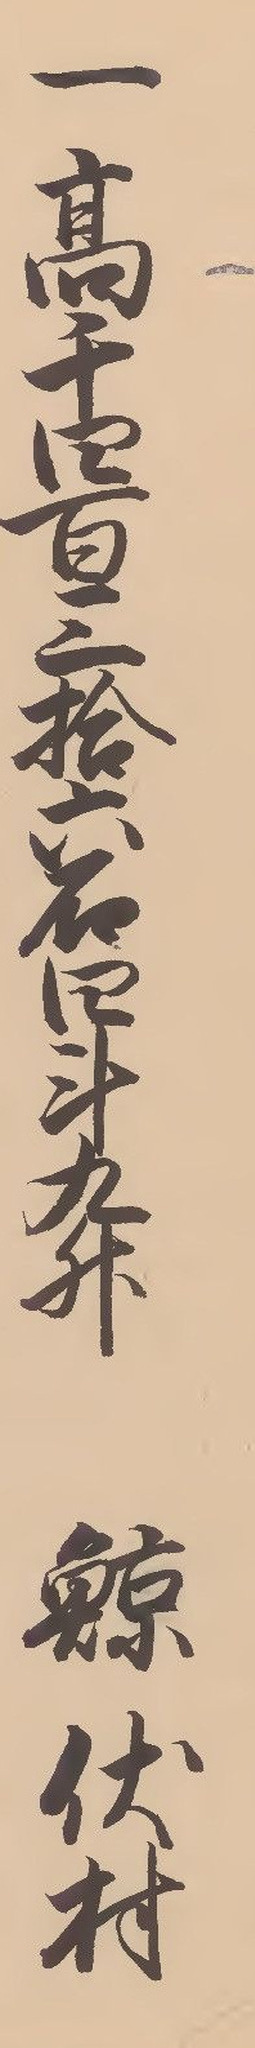一高千四百三拾六石四斗九升鯨伏村
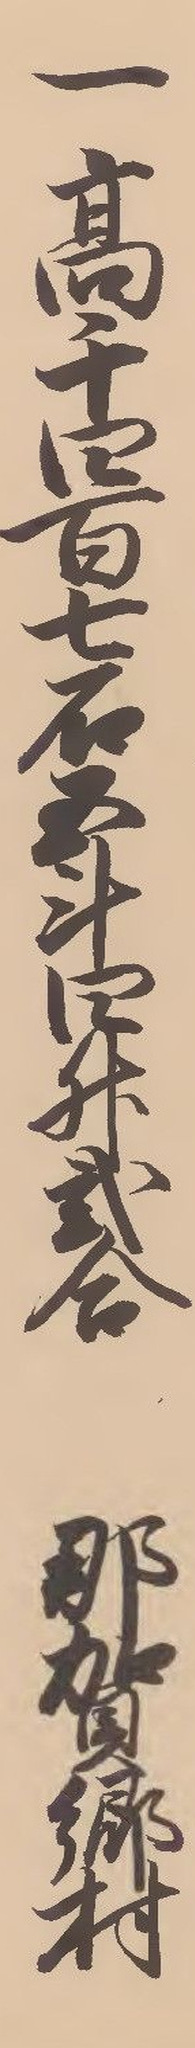一高千四百七石五斗四升弐合那賀郷村
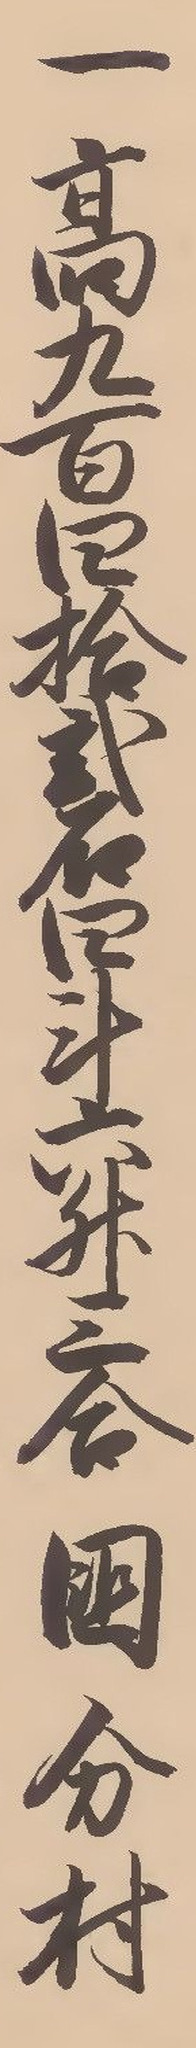一高九百四拾弐石四斗六升三合国分村
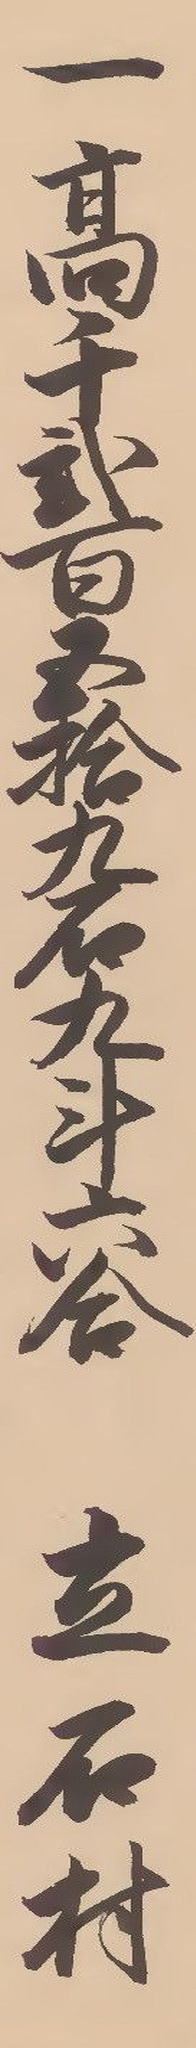一高千弐百五拾九石九斗六合立石村
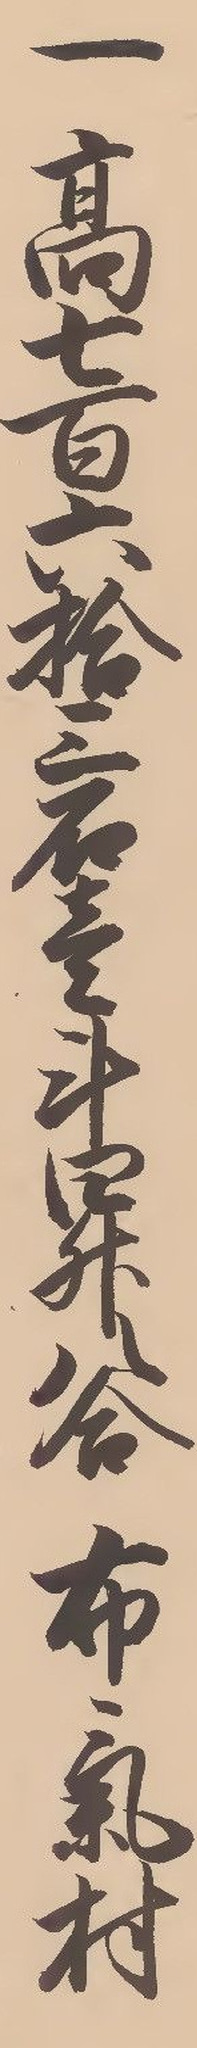一高七百六拾三石壱斗四升八合布気村
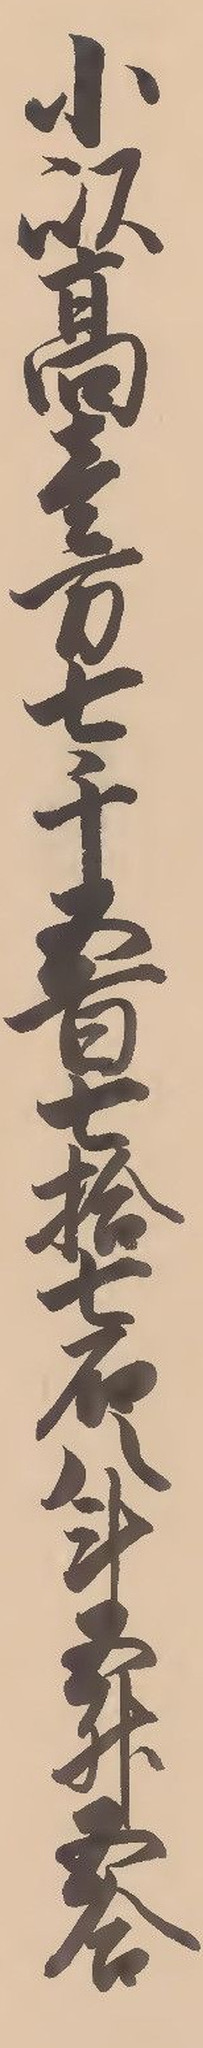小以高壱万七千五百七拾七石八斗五升五合
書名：壱岐国郷帳
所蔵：国立公文書館 National Archives of Japan
